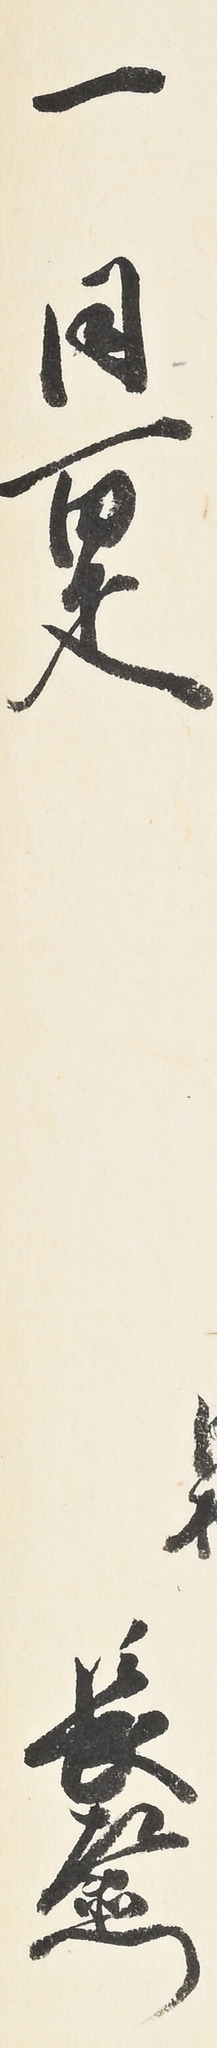一同百疋長左衛門
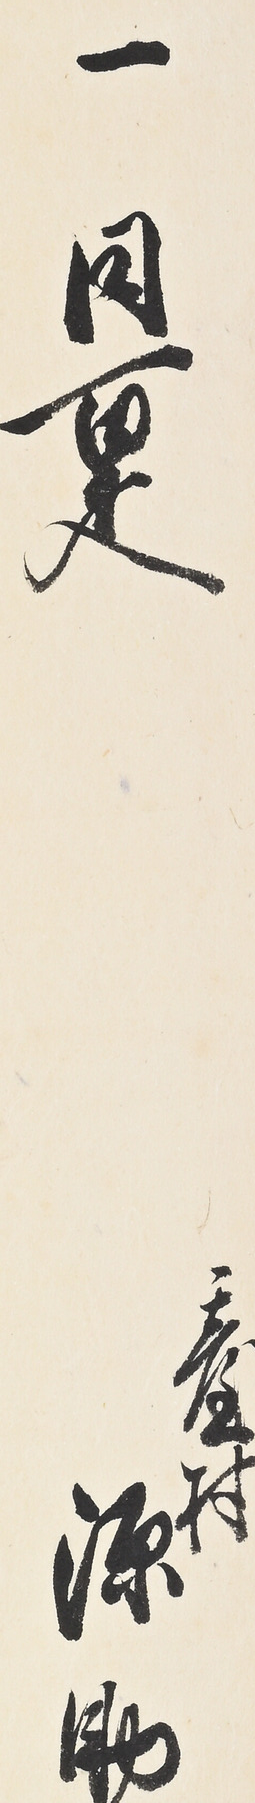一同百疋源助

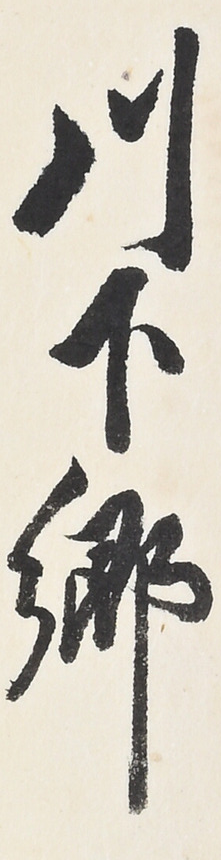川下郷
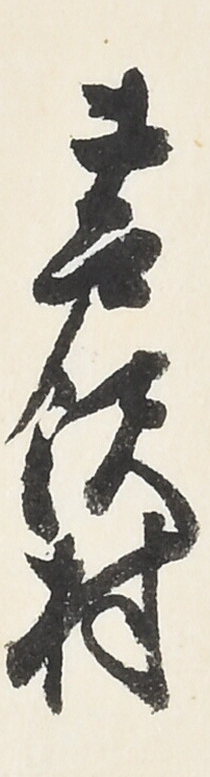芦沢村
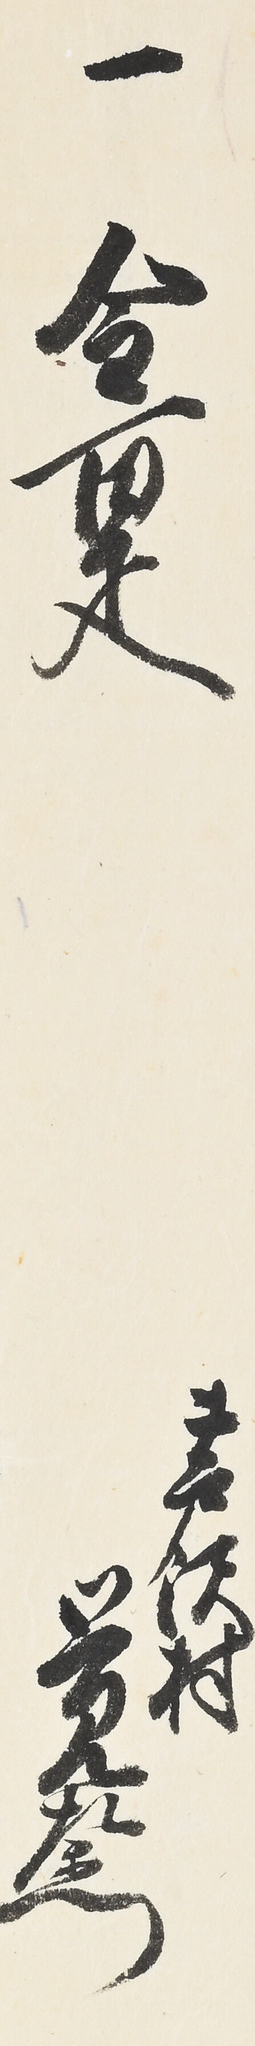一金百疋労左衛門
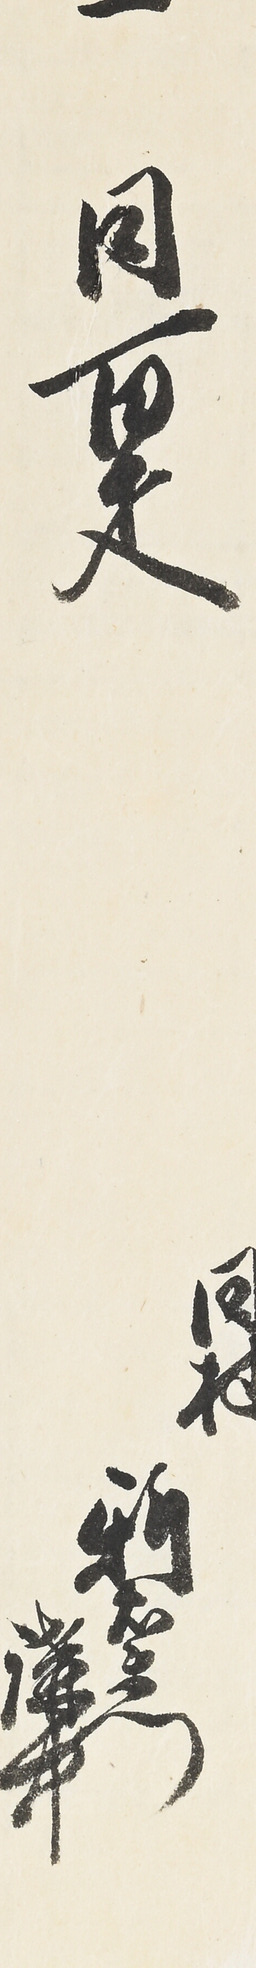一同百疋新右衛門
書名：永代太々御神楽名前帳
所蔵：伊那市立高遠町図書館・合同会社AMANE
